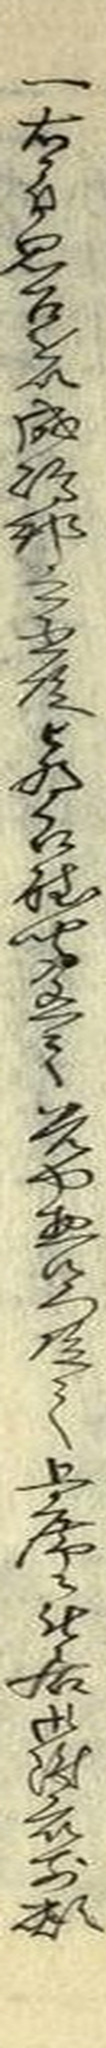一右ニ付思召を以成嶋邦之丞殿被為召聴聞有之谷中惣左衛門殿之上席ニ被居御附衆前頬
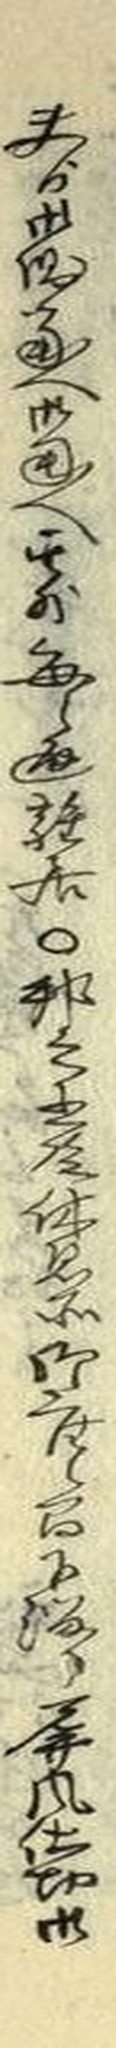夫ゟ御側御用人御用人其外毎之通雑居〇邦之丞殿休息所御座之間下溜り屛風仕切御
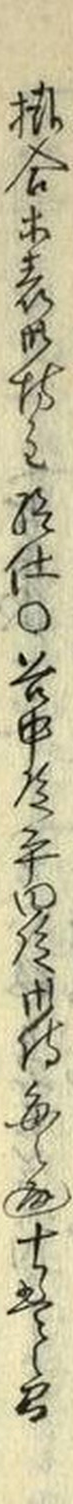掛合等表御坊主給仕〇谷中殿平田殿御侍毎之通十畳之間
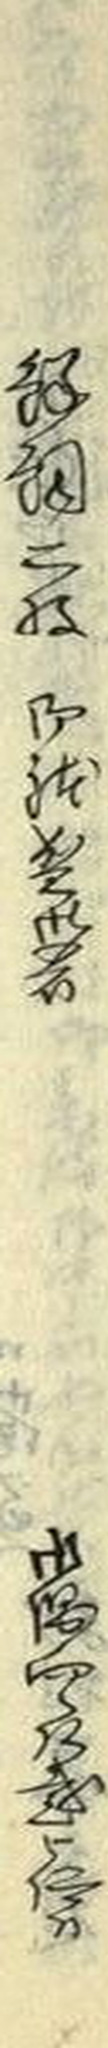鮮鯛二枚御鉢盛御肴御側向へ頂戴被仰付
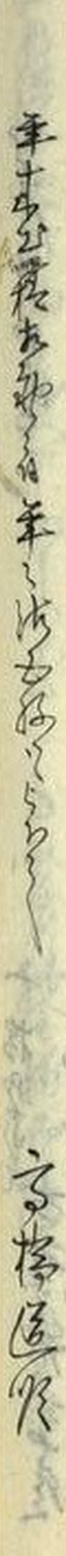年来出精相勤候ニ付年々銀五枚ツヽ被下之高橋道順
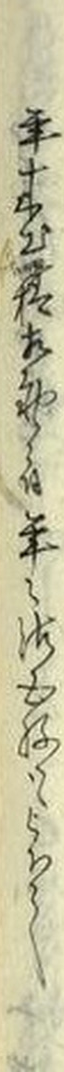年来出精相勤候ニ付年々銀五枚ツヽ被下之高橋道順
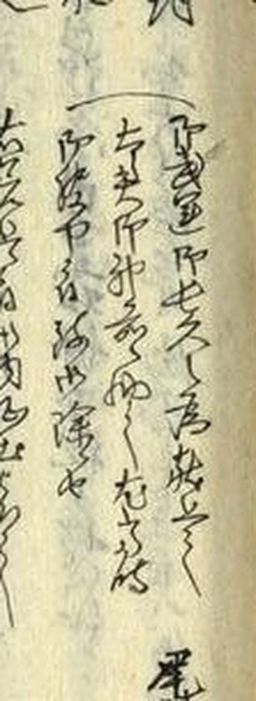大奥御神前へ納之尤当時
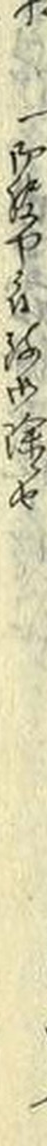御服中ニ付御致御除候由
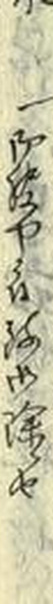御服中ニ付御致御除候由
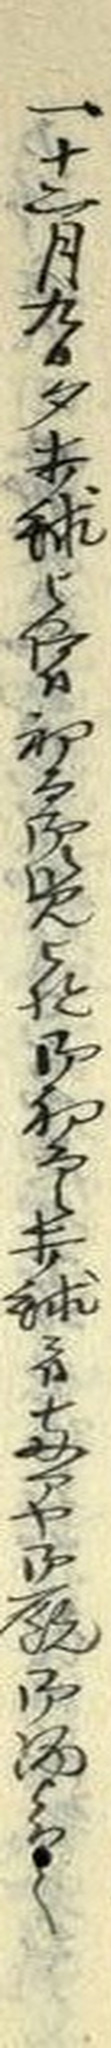一十二月九日夕打毬被仰付初而御覧被遊御初而之打毬ニ付御両部屋御厩御酒被下之
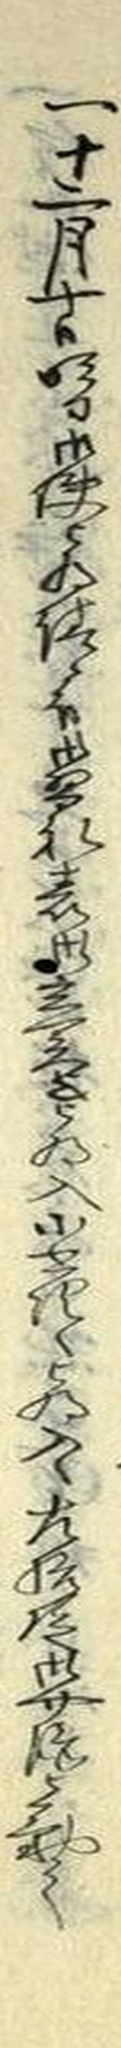一十二月十日明日御使被為請候ニ付御習礼表御玄関迄被為入小書院へ被為入候左膳殿御介添被勤之
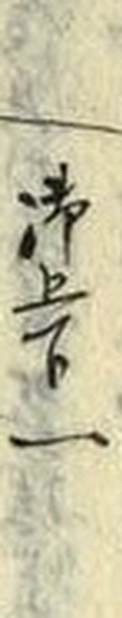御上下一
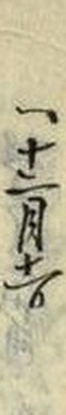一十二月十一日

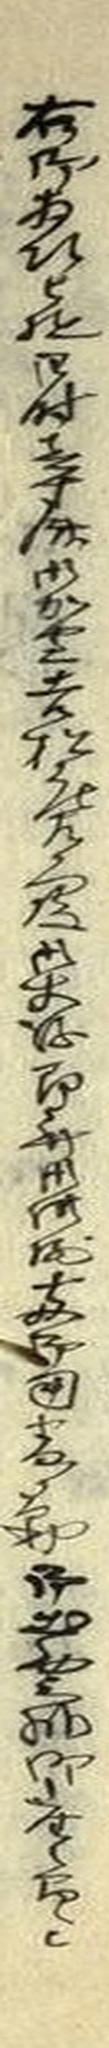右御拝領被遊四時壱寸済御加宜吉松庄左衛門殿御使後即刻御供揃両御用番御勤御出殿掛御座之間へ被
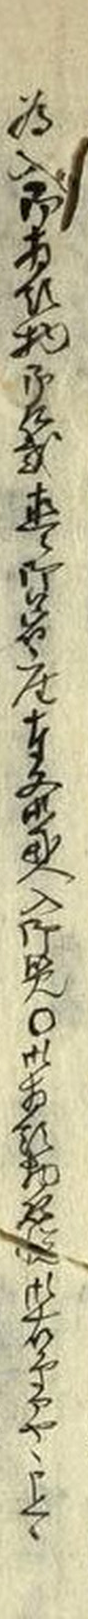為入御拝領物御頂戴直ニ御着座奉文御用人入御覧〇御拝領物恐悦御右筆部屋へ申上候
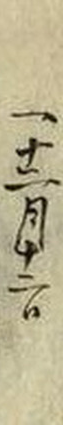一十二月十五日
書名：少傅日録抄（斉善付側向頭取日記、在府）
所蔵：福井県文書館 Fukui Prefectural Archives
